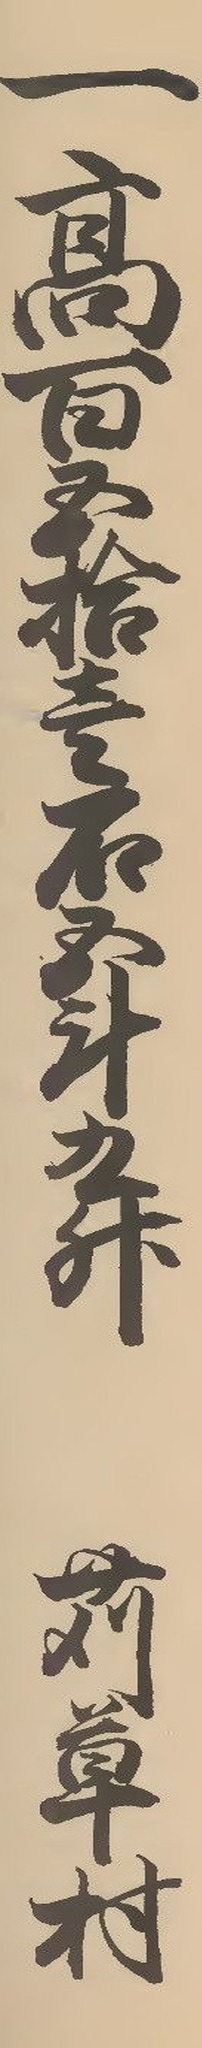一髙百五拾壱石五斗九升苅草村
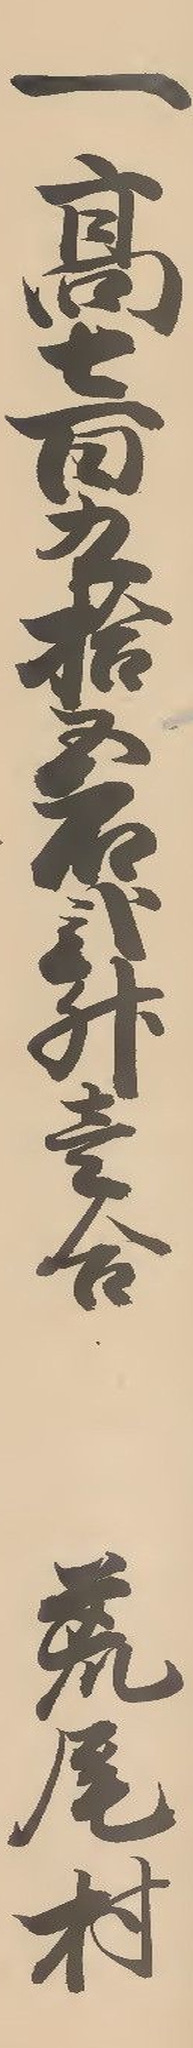一髙七百九拾五石弐升壱合荒尾村
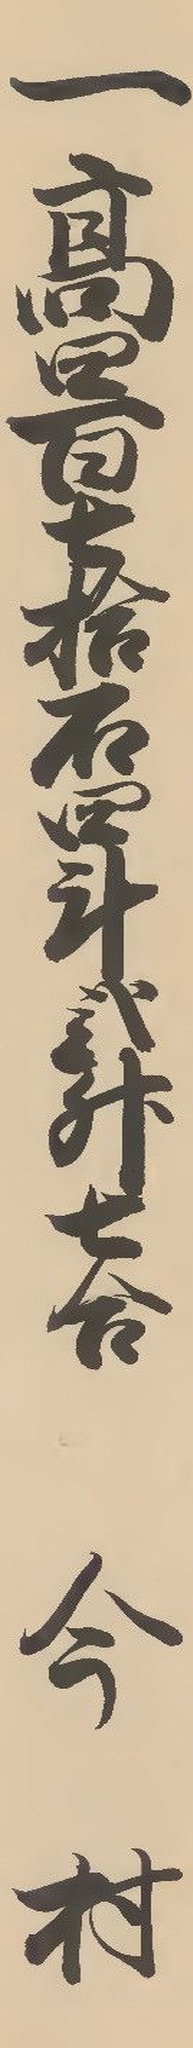一髙四百七拾石四斗弐升七合今村
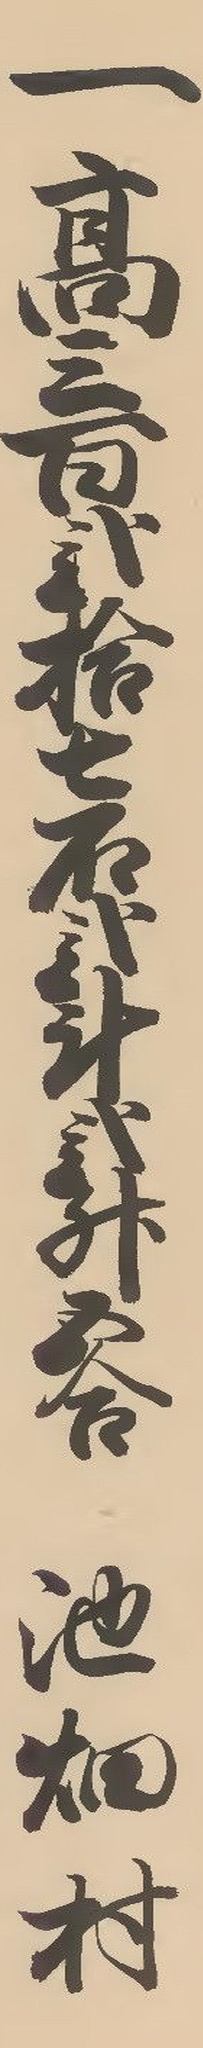一髙三百弐拾七石弐斗弐升五合池畑村
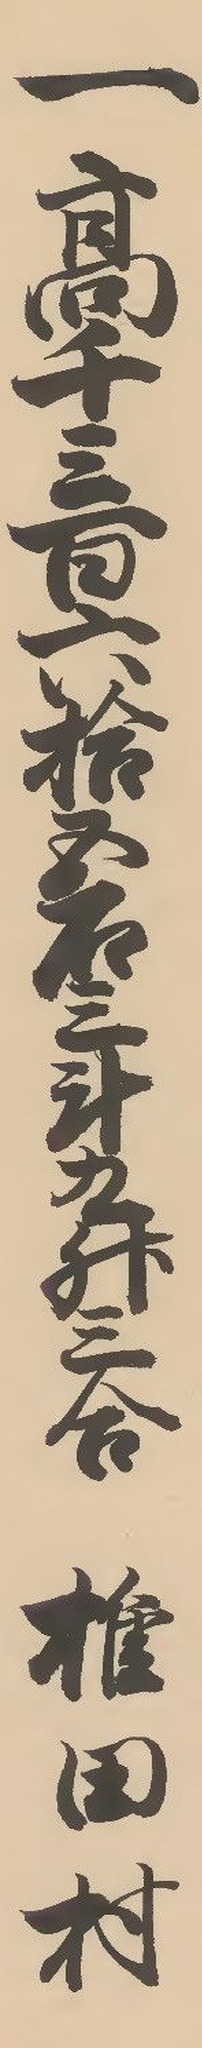一髙千三百六拾五石三斗九升弐合椎田村

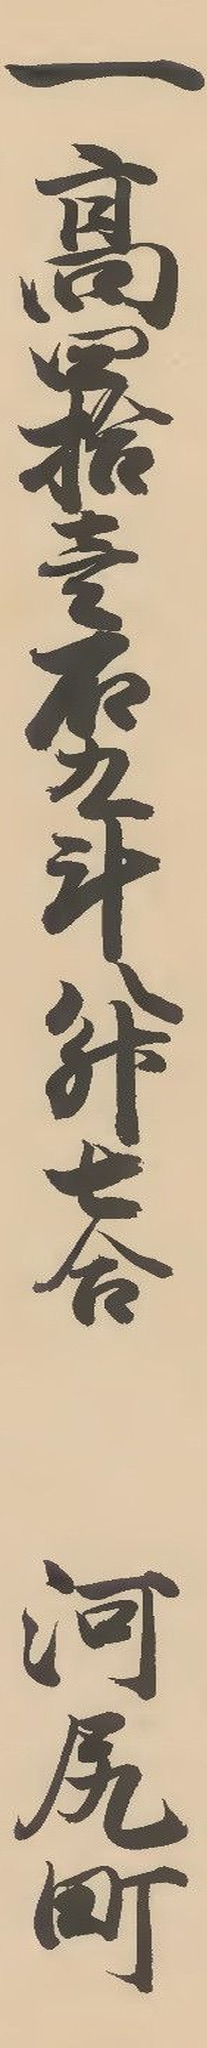一髙四拾壱石九斗八升七合河尻町
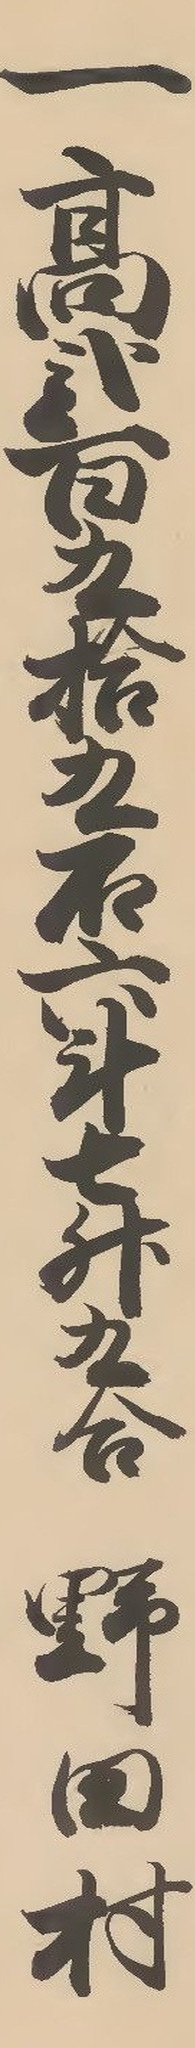一髙弐百九拾九石六斗七升九合野田村
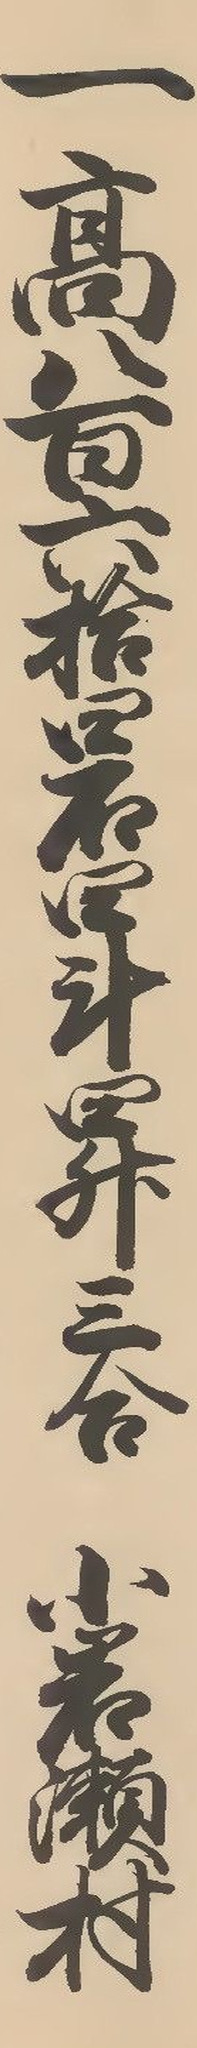一髙八百六拾四石四斗四升三合小岩瀬村
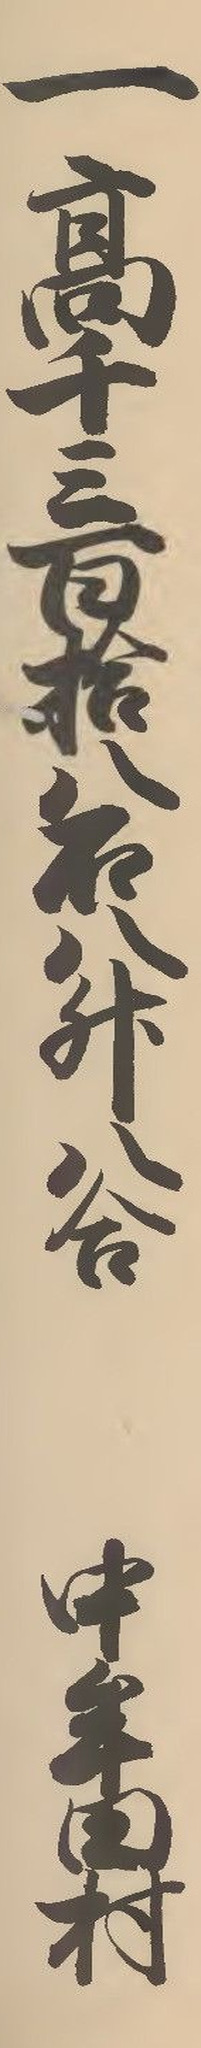一髙千三百拾八石八升八合中牟田村
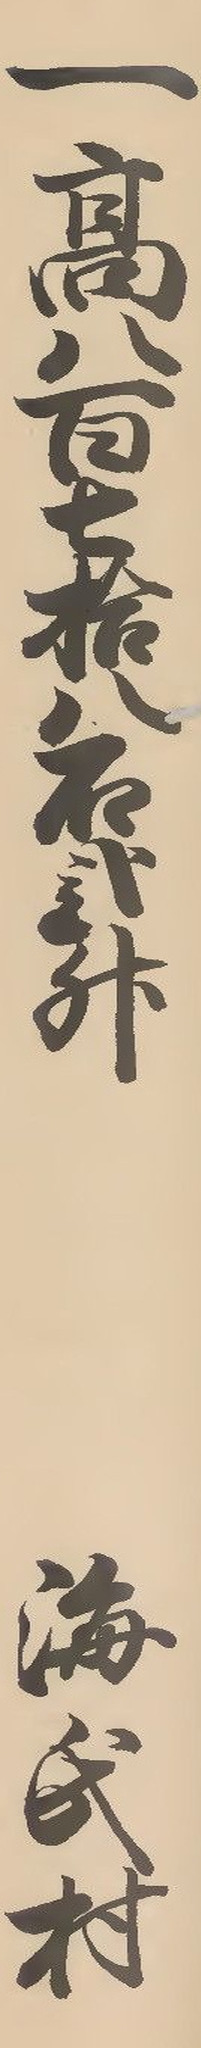一髙八百七拾八石弐升海氏村
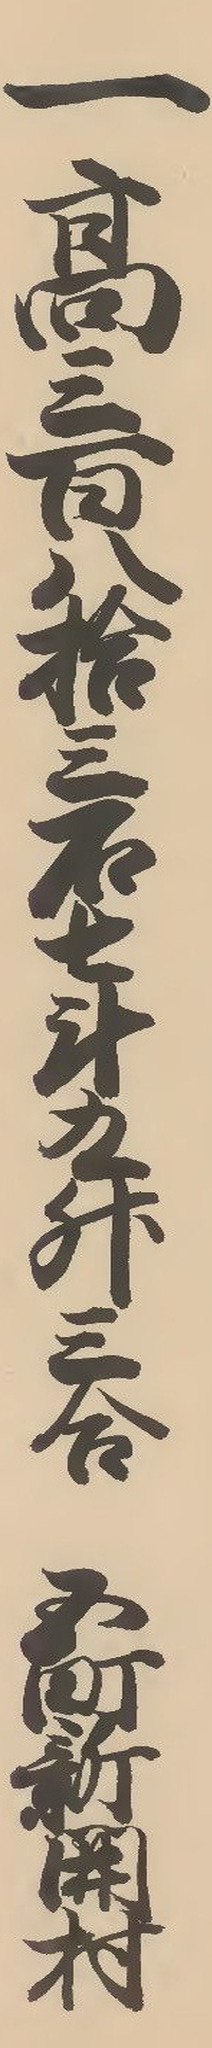一髙三百八拾三石七斗九升三合五町新開村
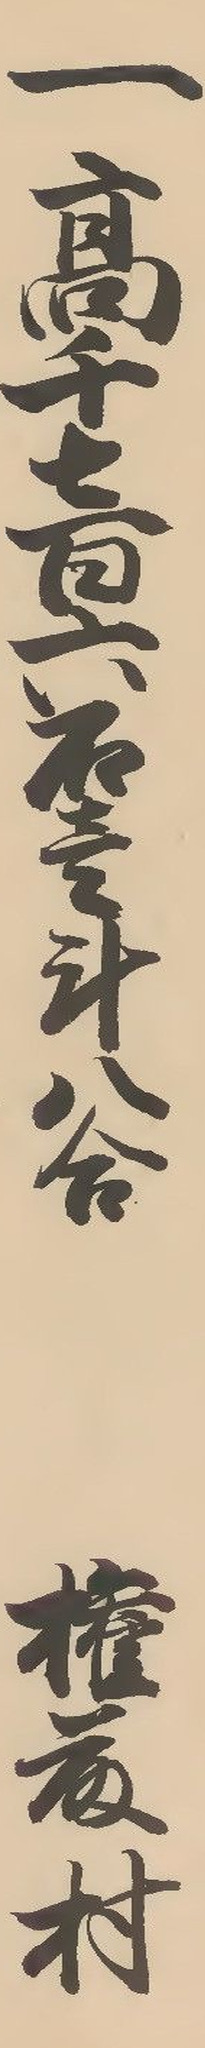一髙千七百六石壱斗八合権藤村
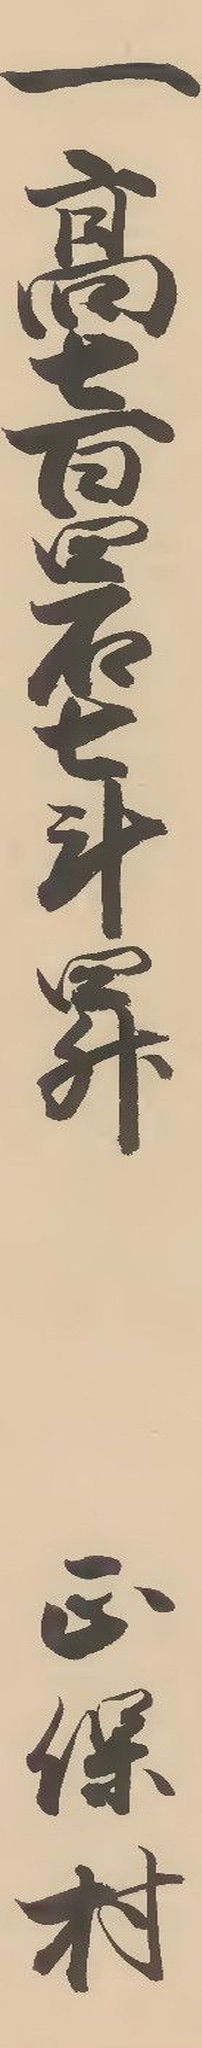一髙七百四石七斗四升正保村

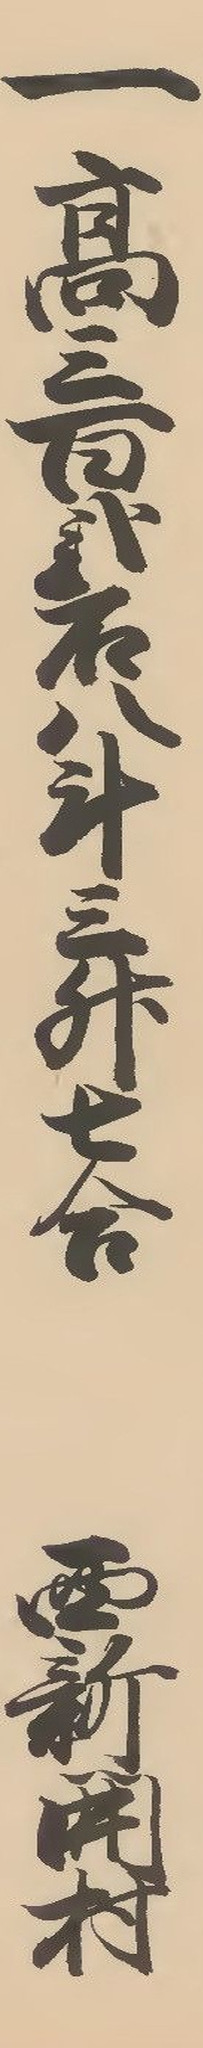一髙三百弐石八斗三升七合西新開村
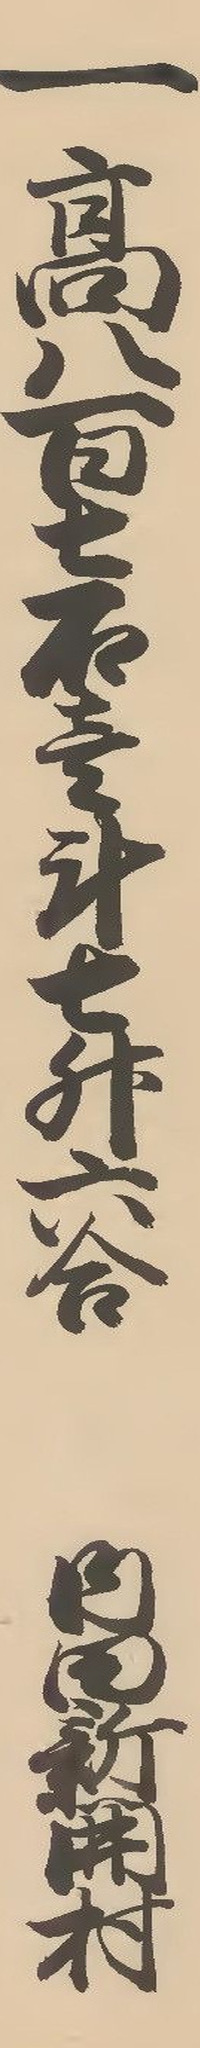一髙八百七石壱斗七升六合内田新開村
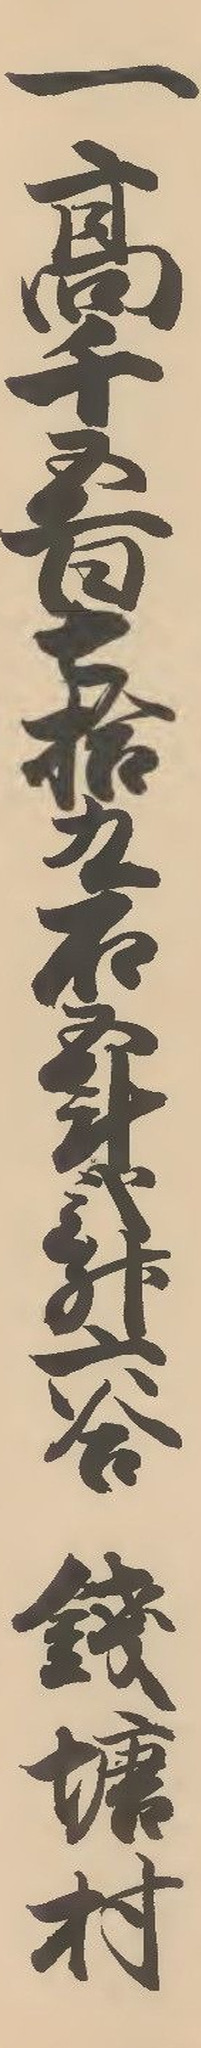一髙千五百七拾九石五斗弐升六合銭塘村
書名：肥後国郷帳
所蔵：国立公文書館 National Archives of Japan
